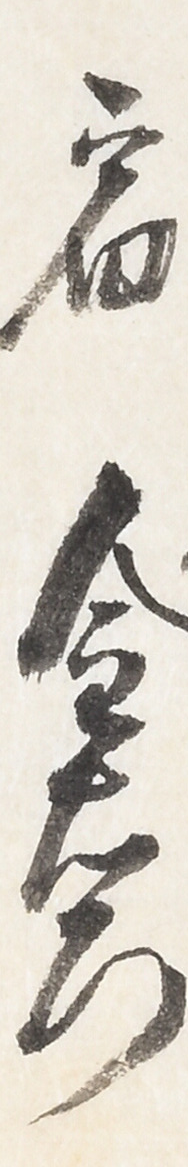宿金右衛門
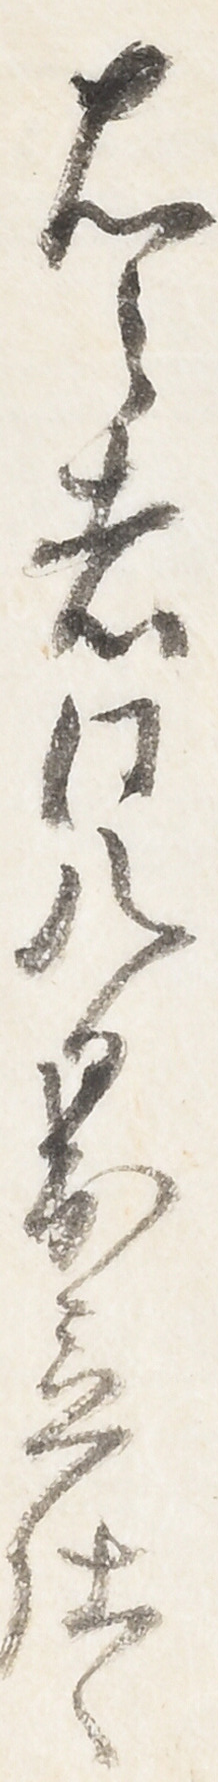右之者同八日出立仕候
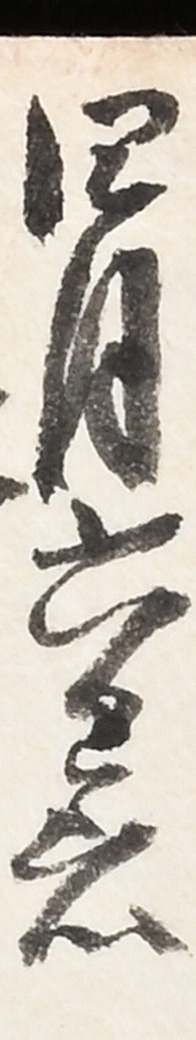四月八日着
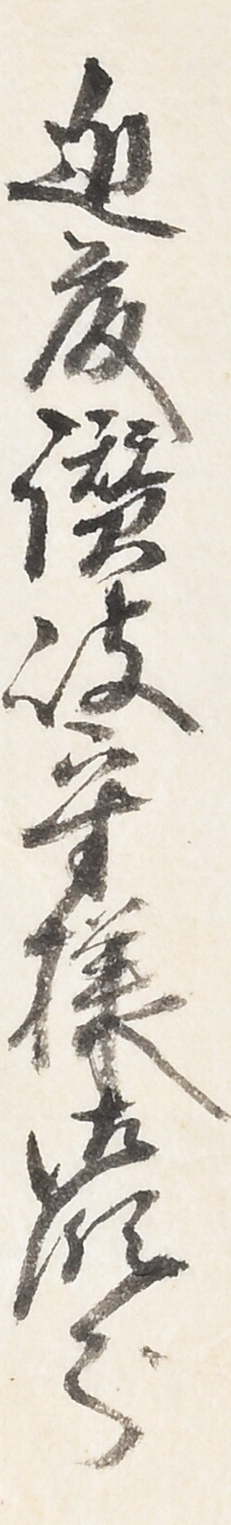近藤讃岐守様御領分
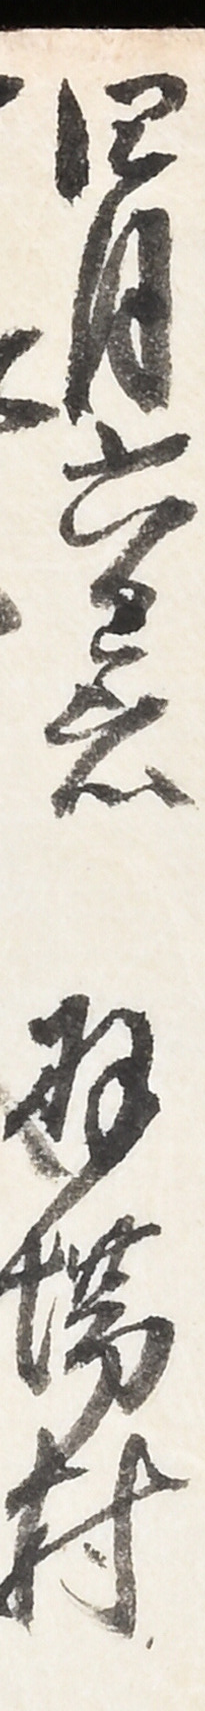四月六日着羽場村
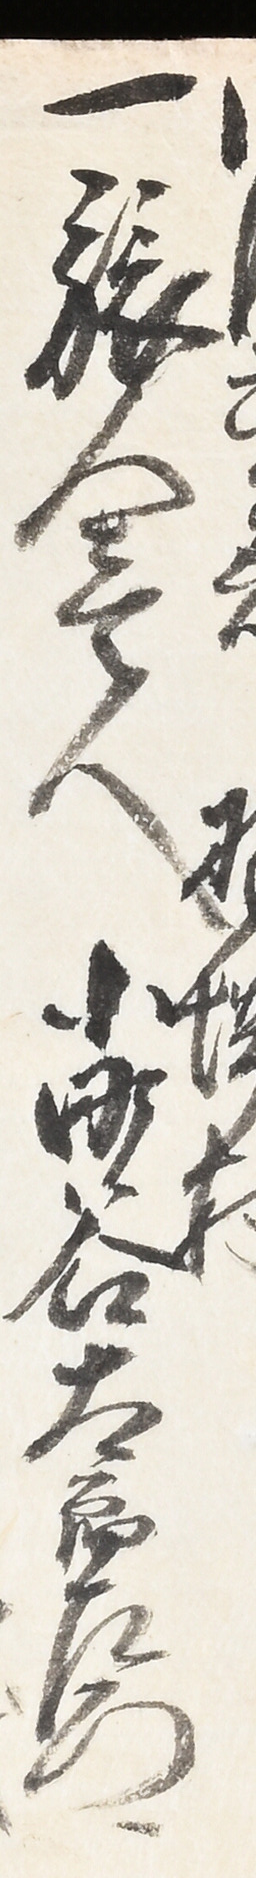一旅人壱人小町谷太郎左衛門・
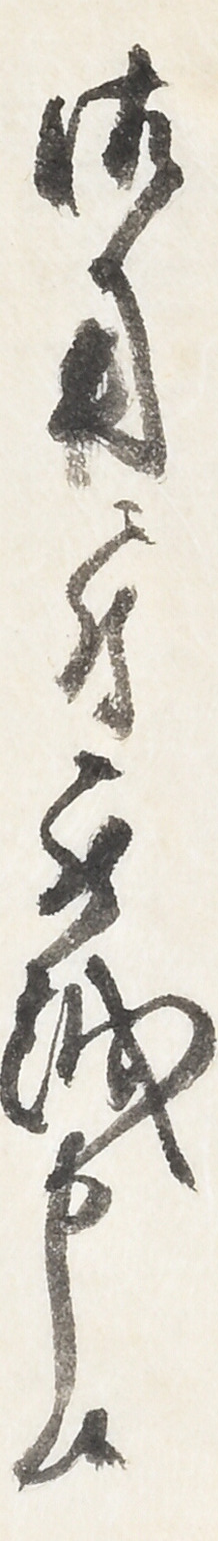御用ニ付罷越申候
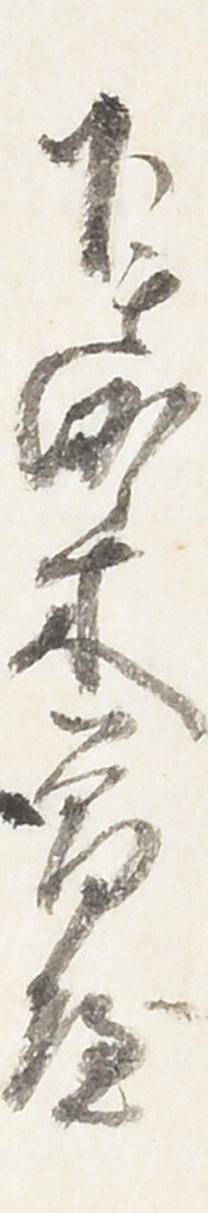下モ町木曽屋
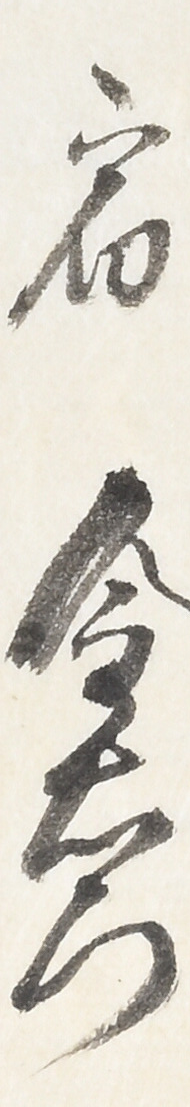宿金右衛門
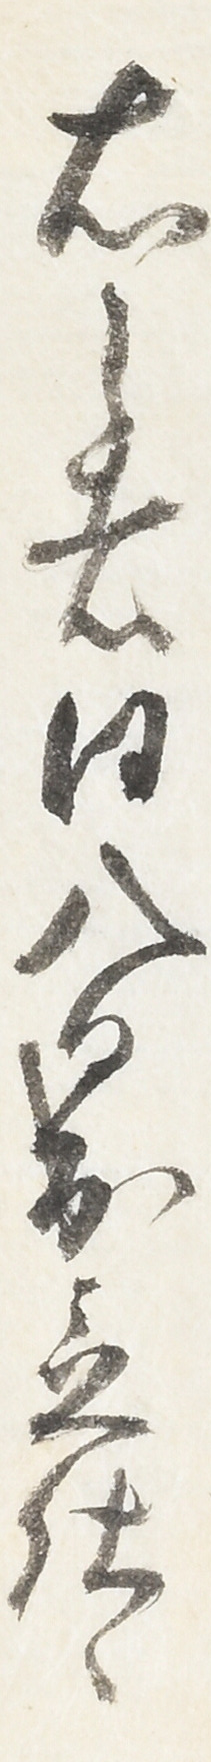右之者同八日出立仕候
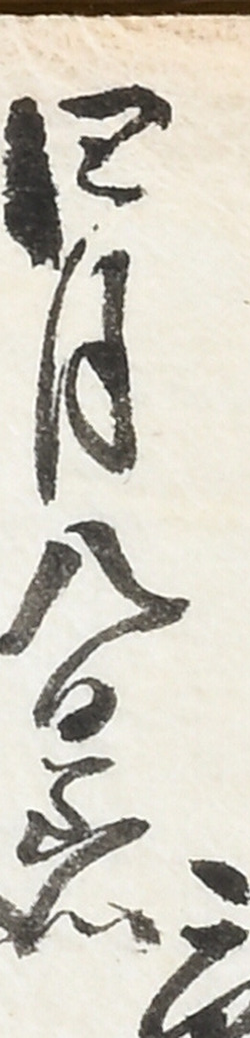四月八日着
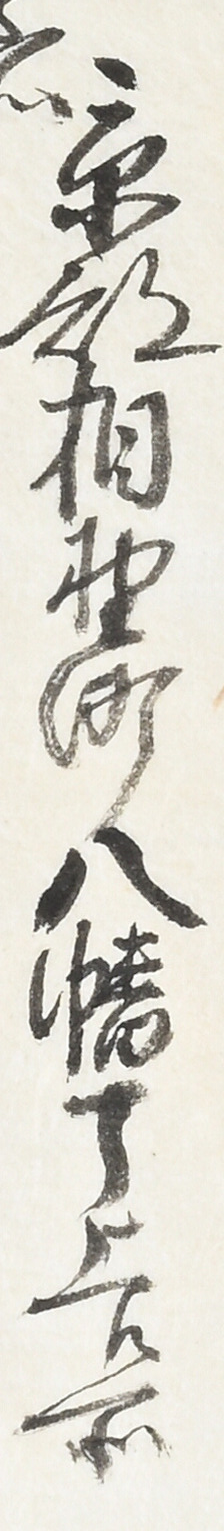京都相野町八幡丁上ル所
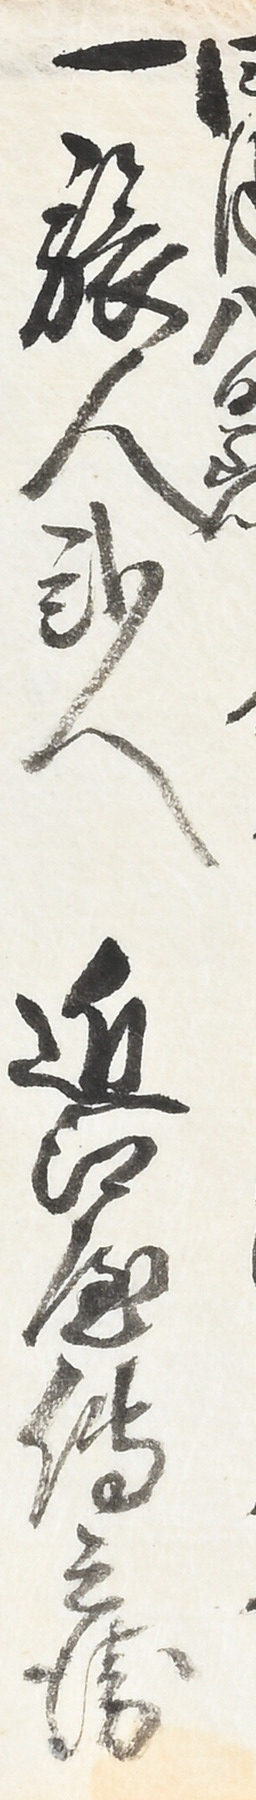一旅人弐人近江屋伝兵衛
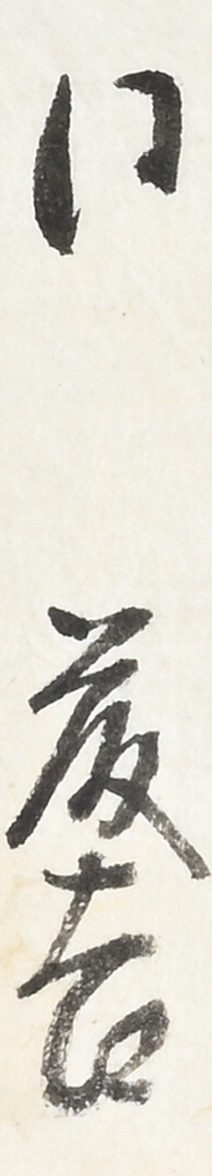同藤吉
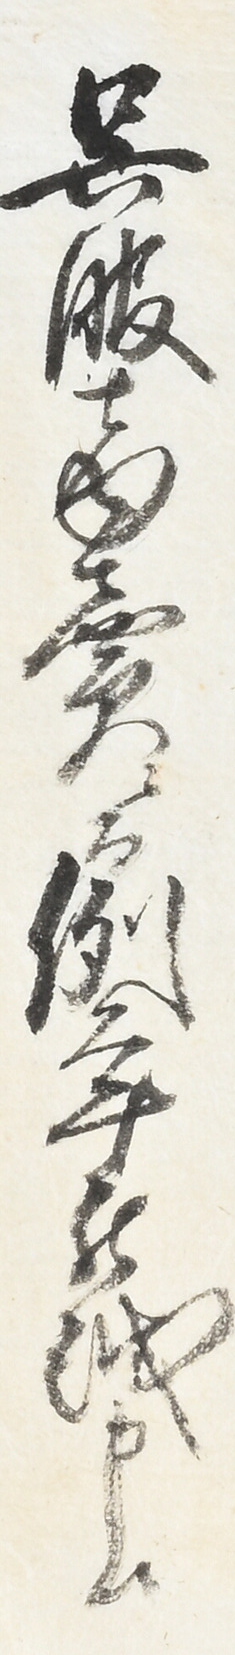呉服商売ニ而例年罷越申候

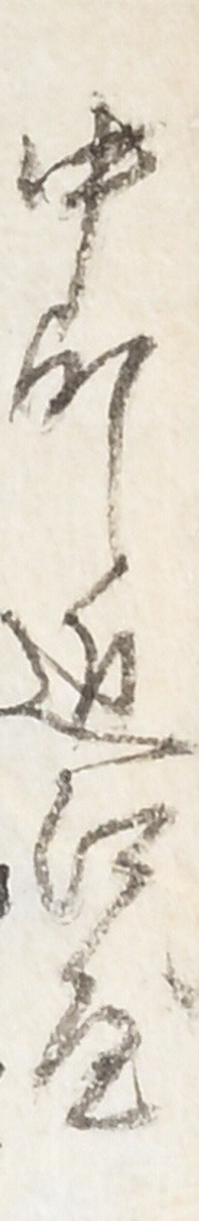中町近江屋
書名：旅人泊控帳
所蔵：伊那市立高遠町図書館・合同会社AMANE
